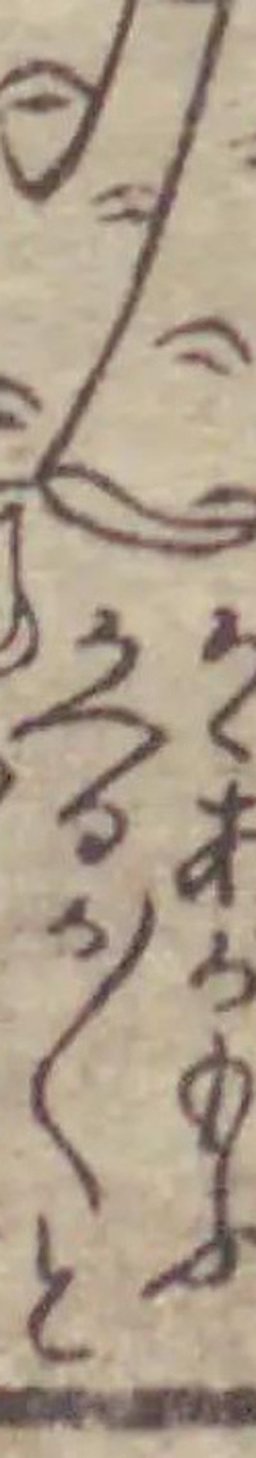かへるか〳〵と
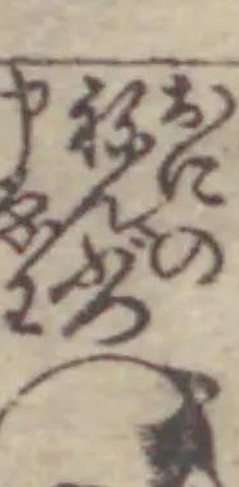ねんぶつ
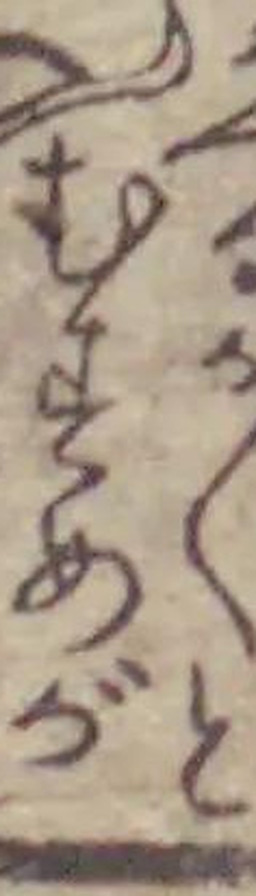むすめが
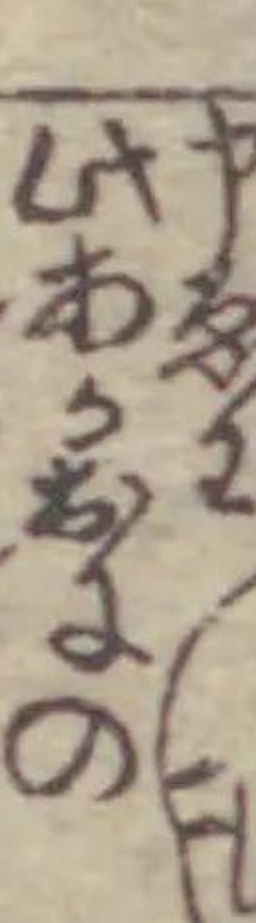此あかおにの
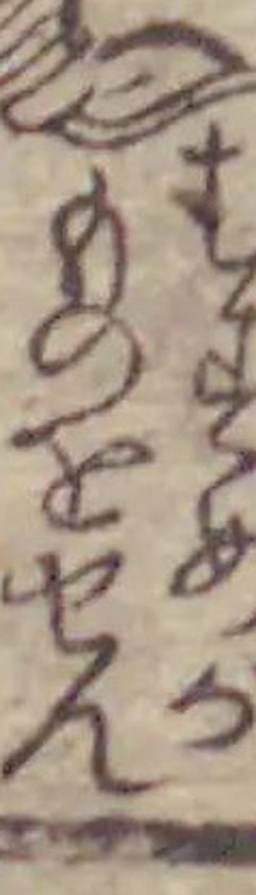ものをせん
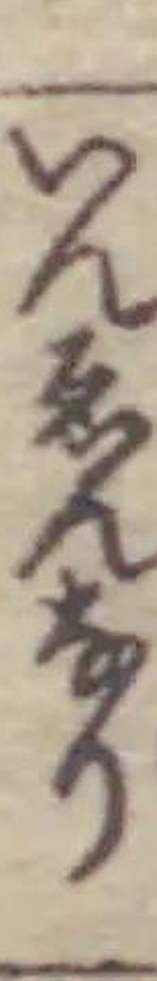いんゑんなり
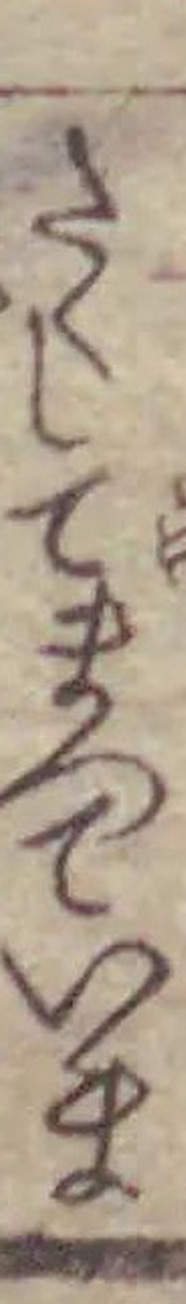たくしてまつていま
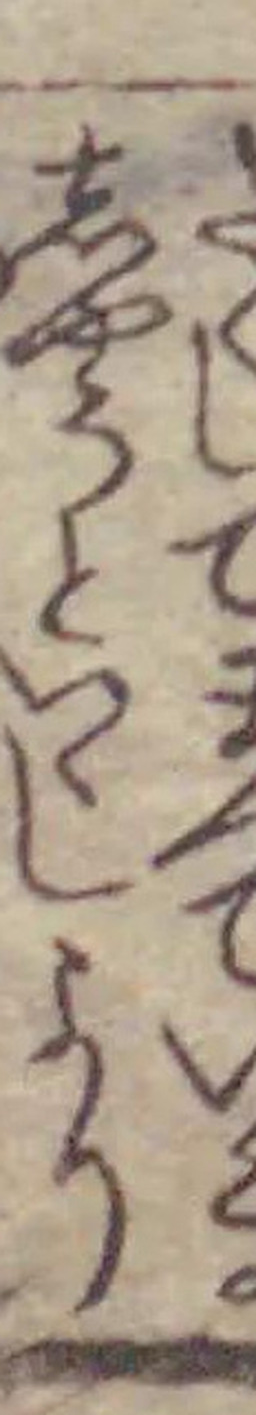しやうといゝしより
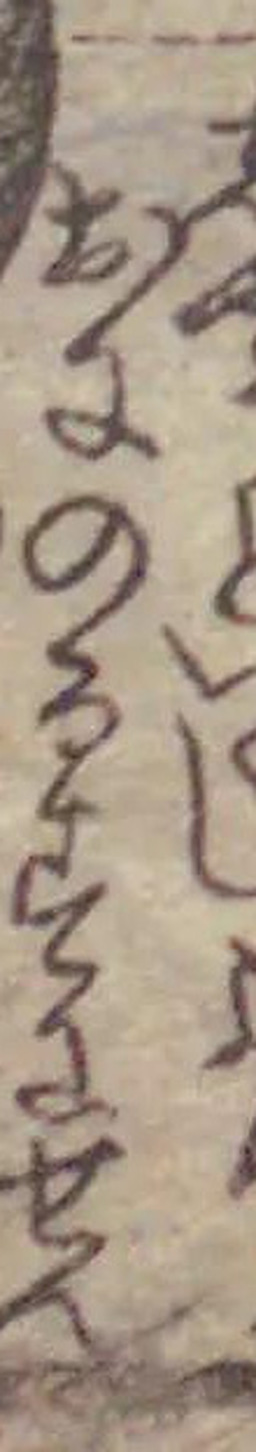おにのるすにせん
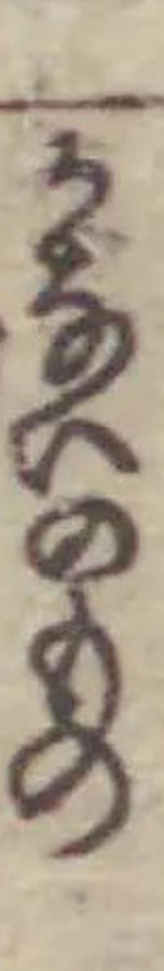かないのもの
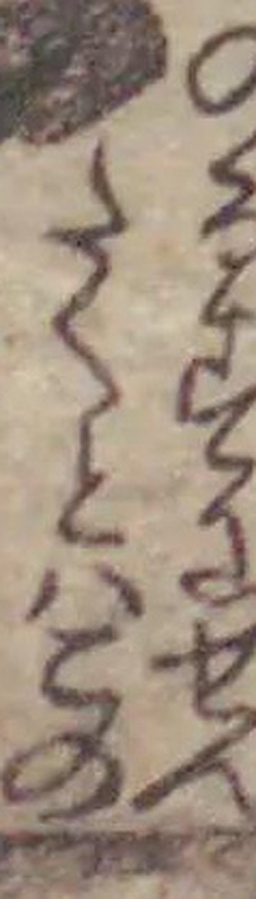たくとはこの
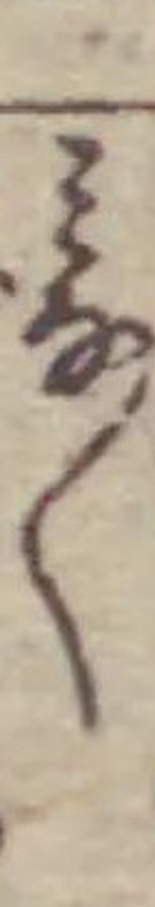みな〳〵
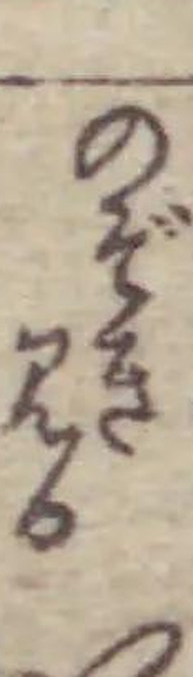のぞき

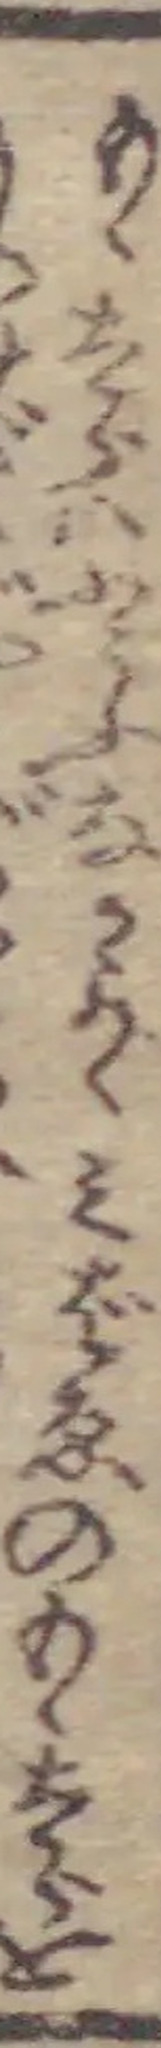もゝ太郎はふうふなかよくみばゑのもゝ太郎を
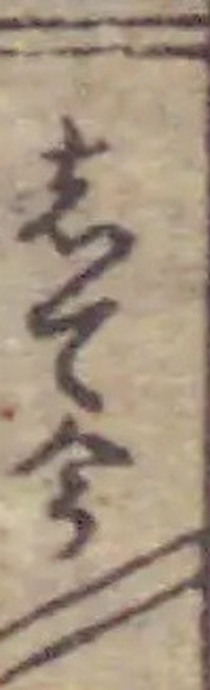して今
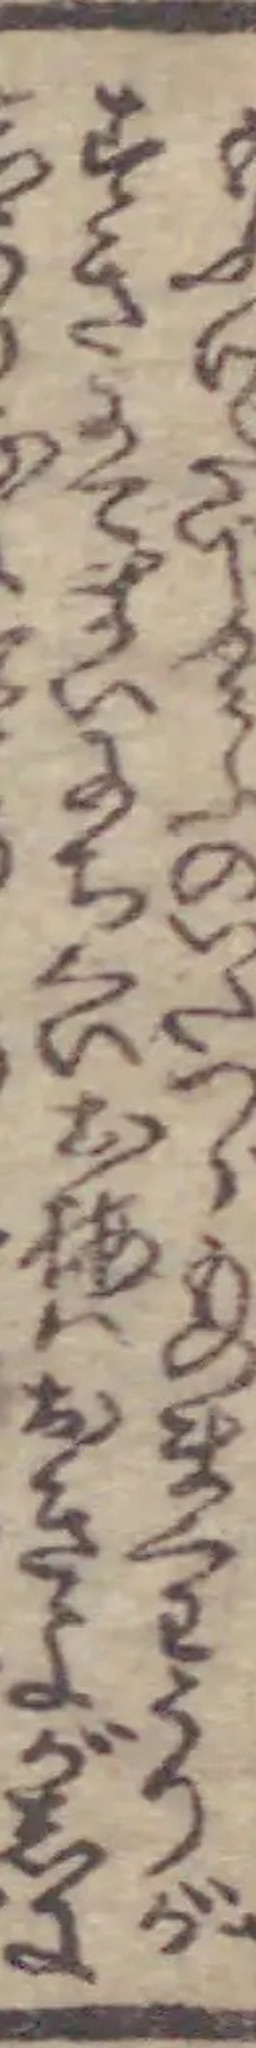すきにてまいにちくいお梅はおきよがしに
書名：桃太郎元服姿 2巻
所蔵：国立国会図書館 National Diet Library, JAPAN
